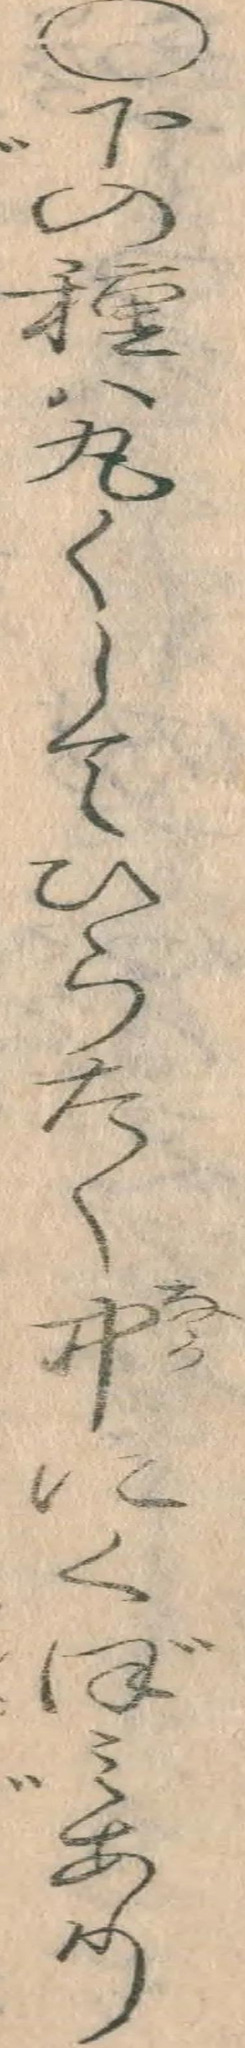○下の種は丸くしてひらたく中にくぼみあり
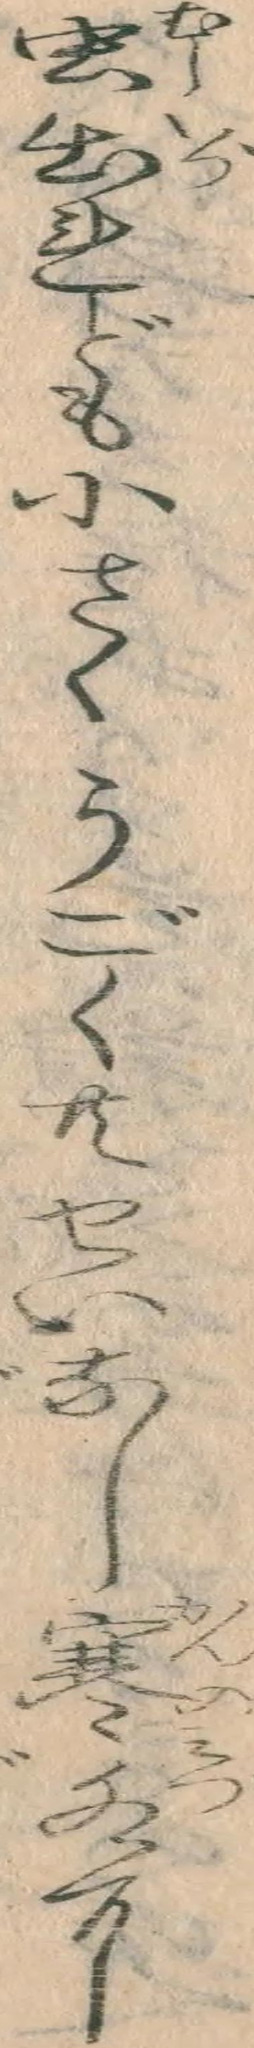虫出れども小さくうごく共せいなし寒水に
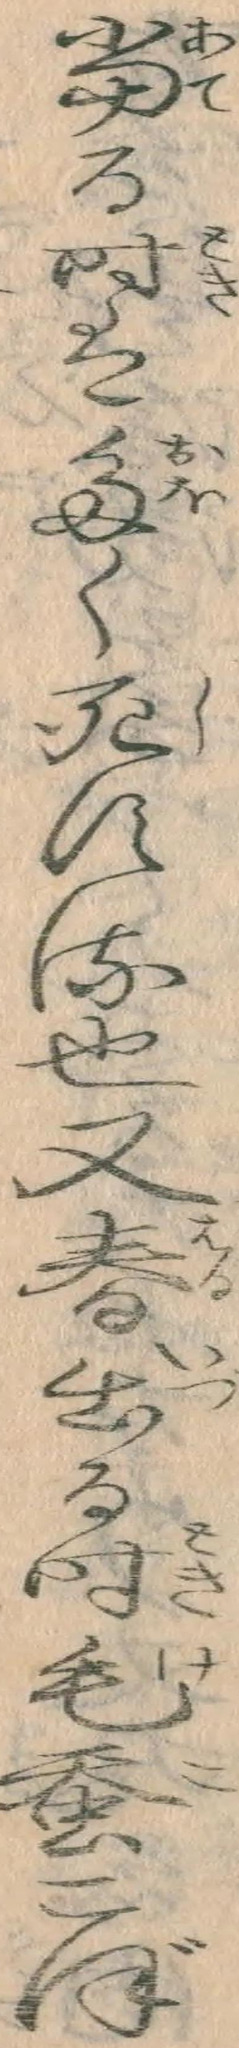当る時は多く死する也又春出る時毛蚕こぼ
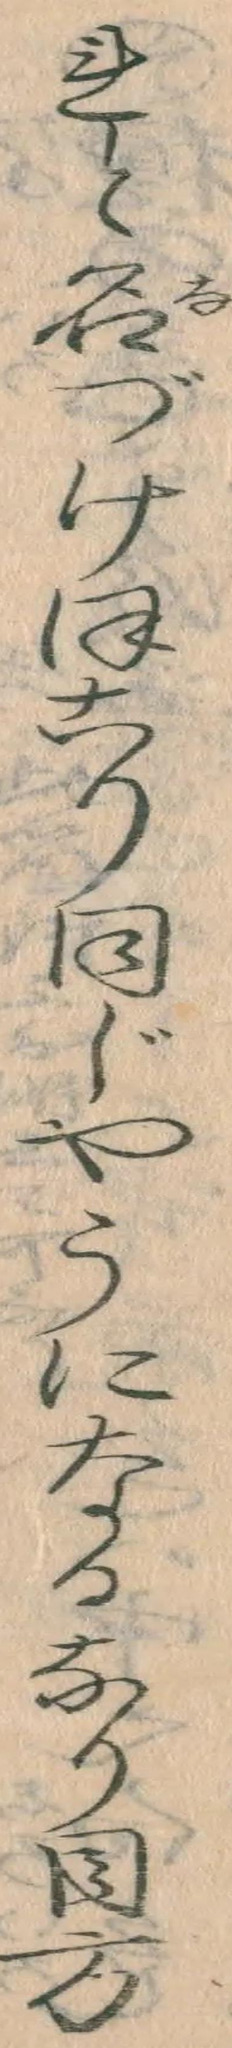れと名づけほこり同じやうになるなり目方
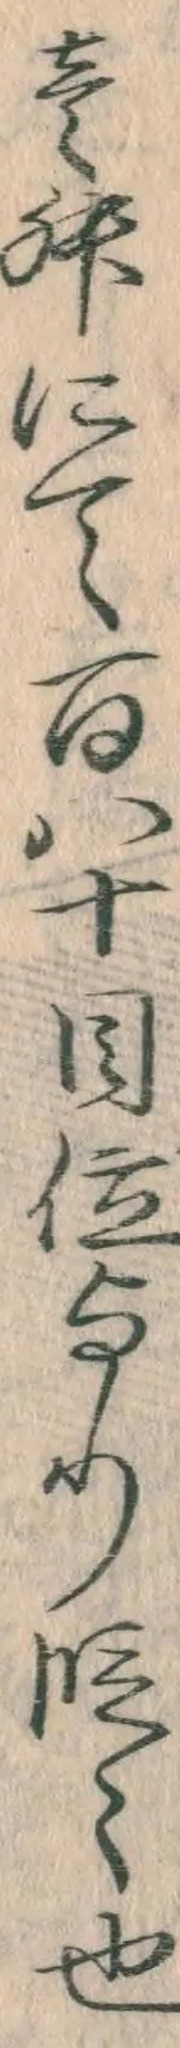壱升にて百八十目位より段々也
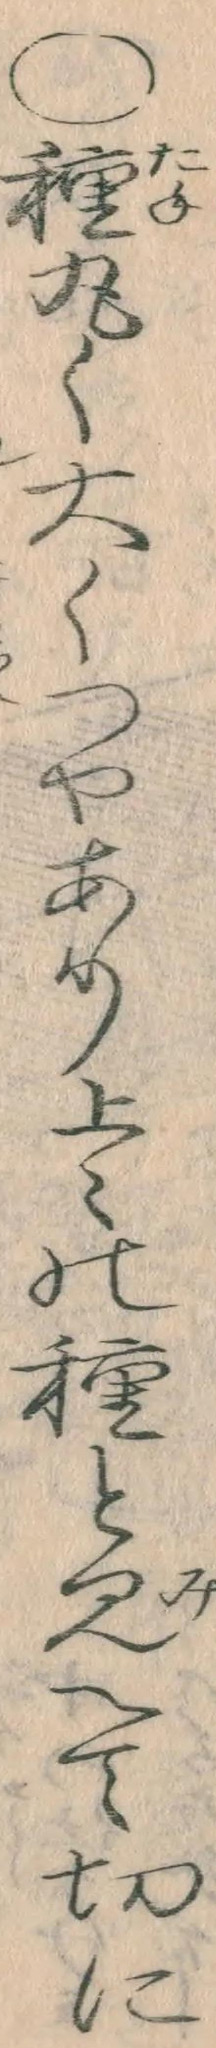○種丸く大くつやあり上々の種と見へて切に
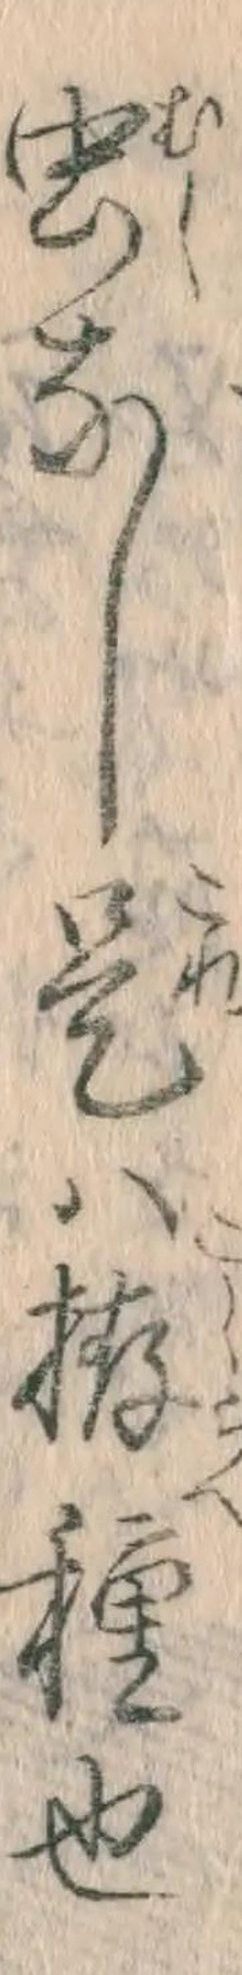虫なし是は拵種也
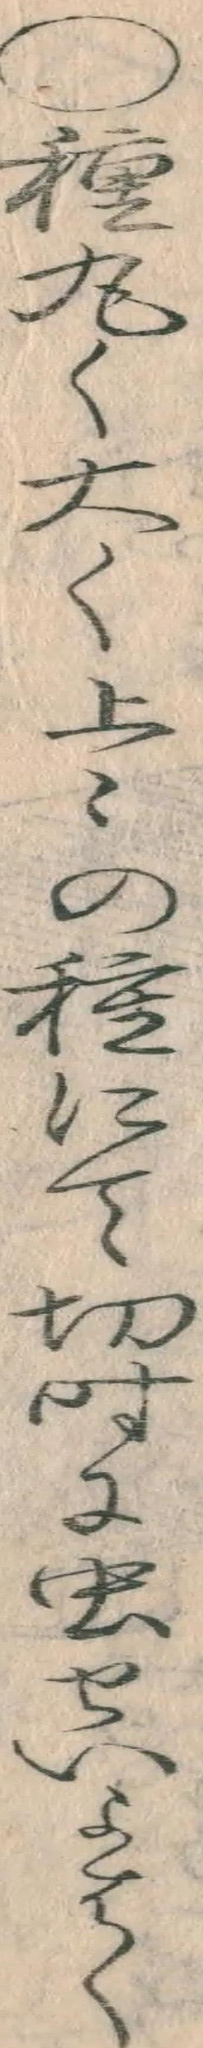○種丸く大く上々の種にて切時に虫せいよはく
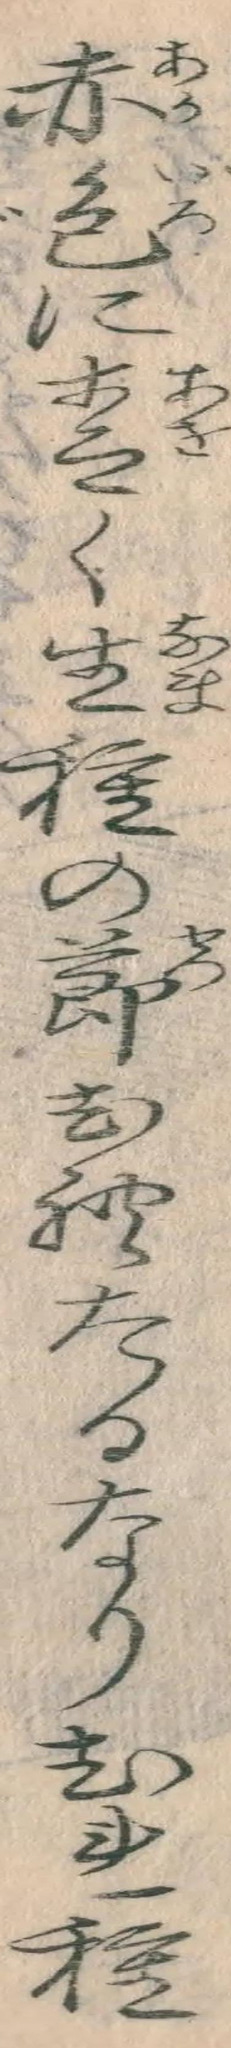赤色に青く生種の節むれたるなりむれ種
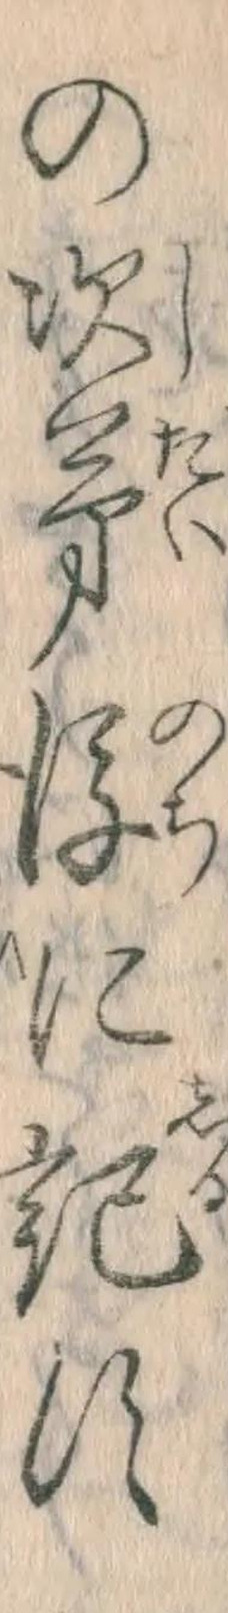の次第後に記す
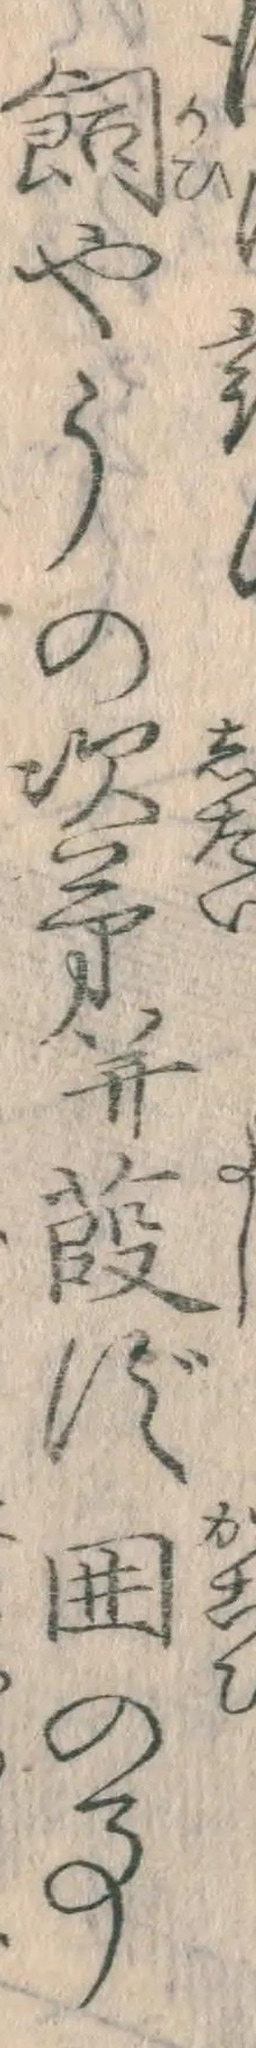飼やうの次第幷葭ず囲の事
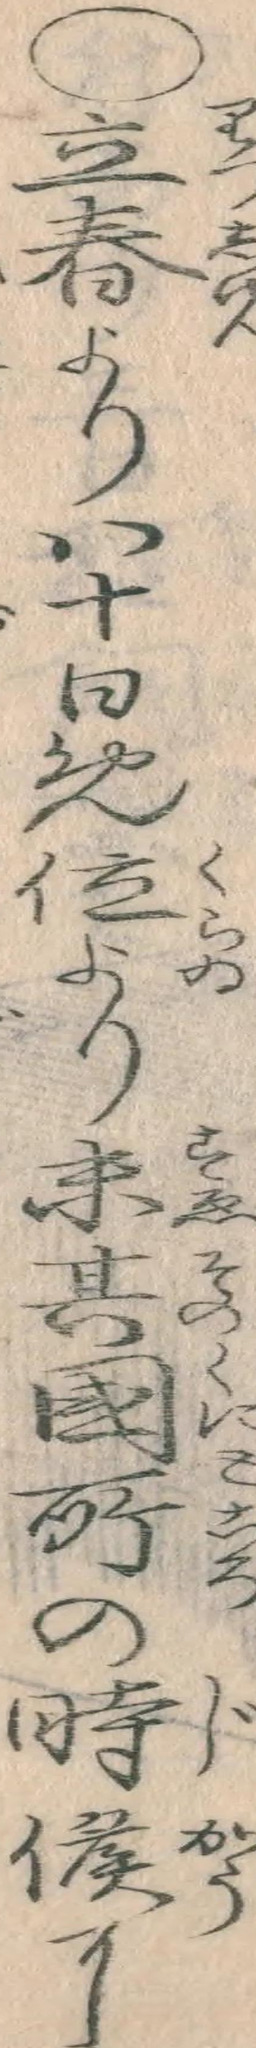○立春より八十日め位より末其國所の時候に
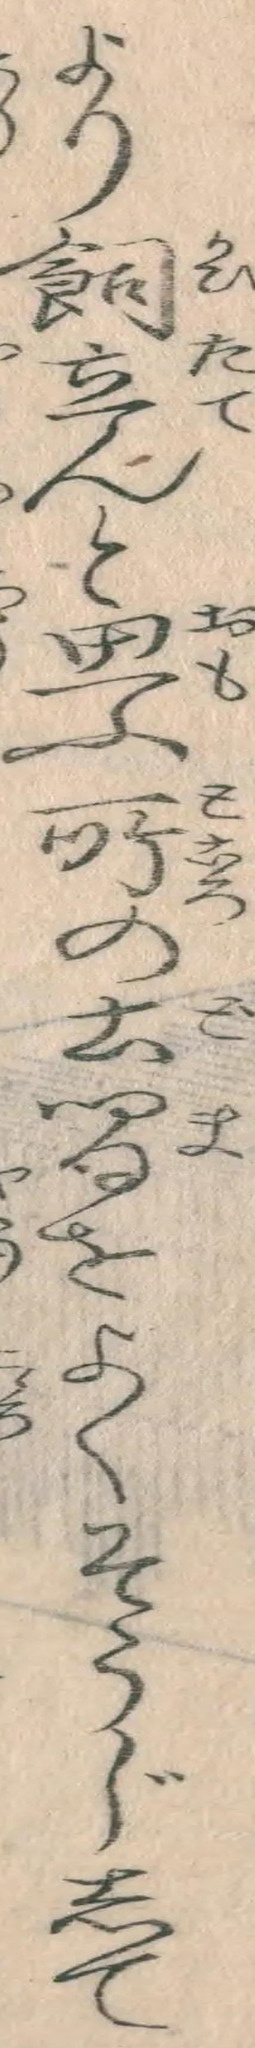より飼立んと思ふ所の土間をよくそうじして
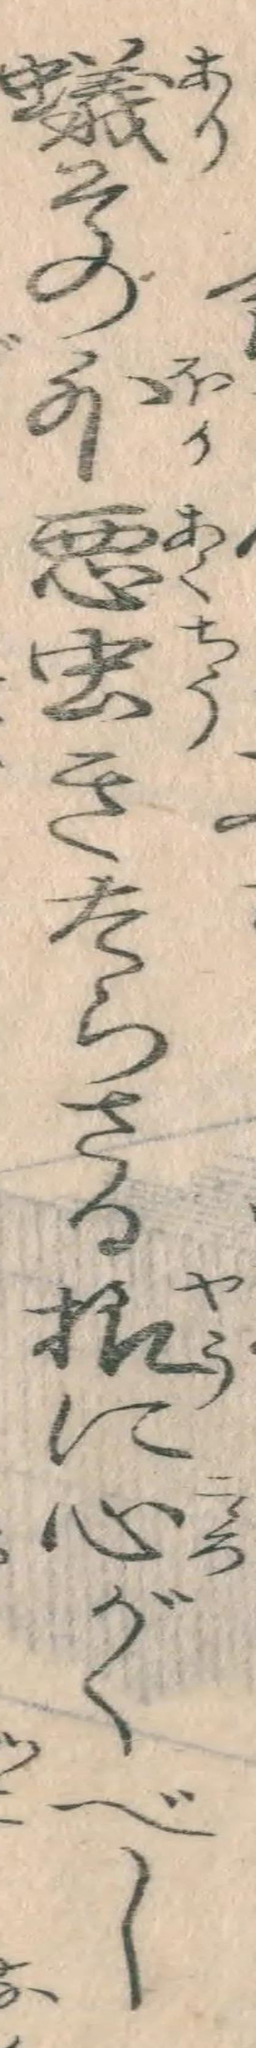蟻その外悪虫きたらさる様に心がくべし
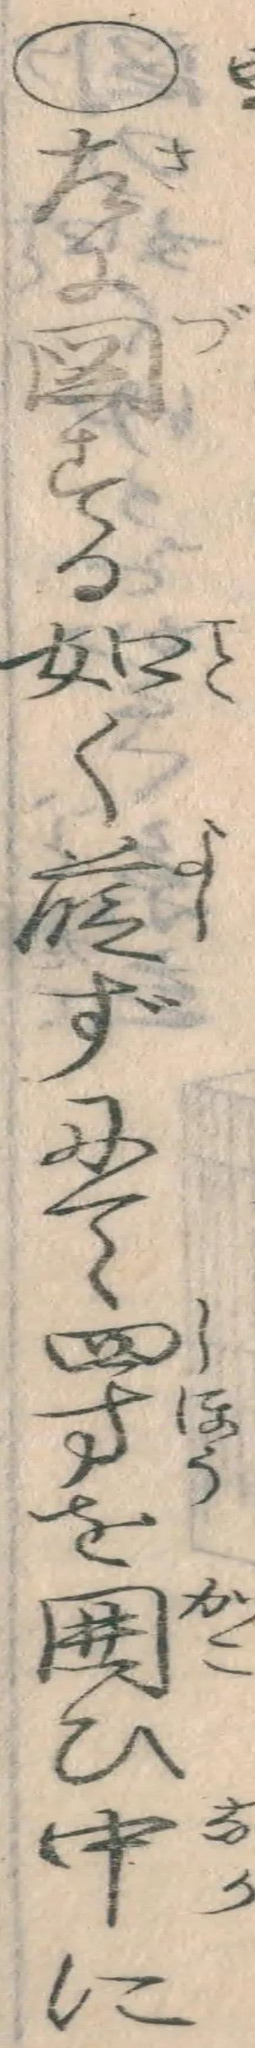○左に図する如く葭ずにて四方を囲ひ中に

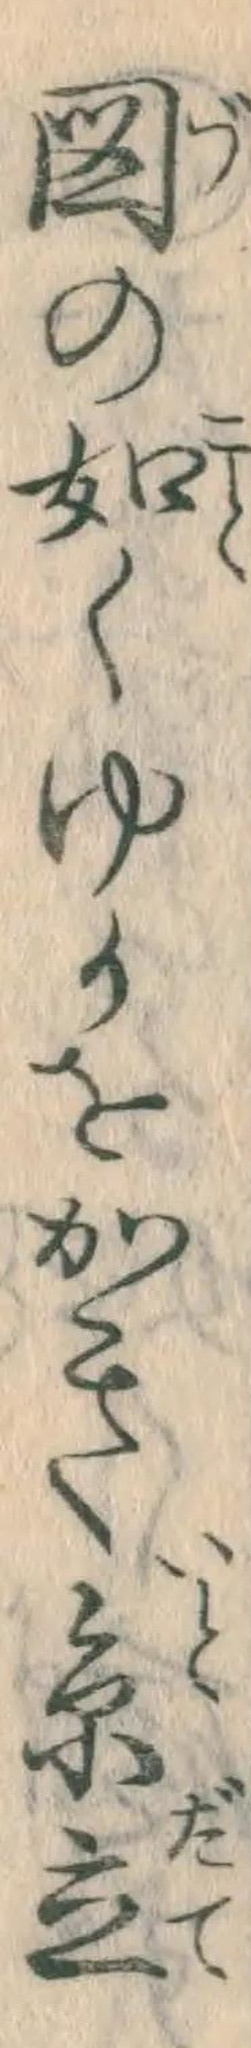図の如くゆかをかき糸立
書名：山繭養法秘傳抄
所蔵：国立国会図書館 National Diet Library, JAPAN
